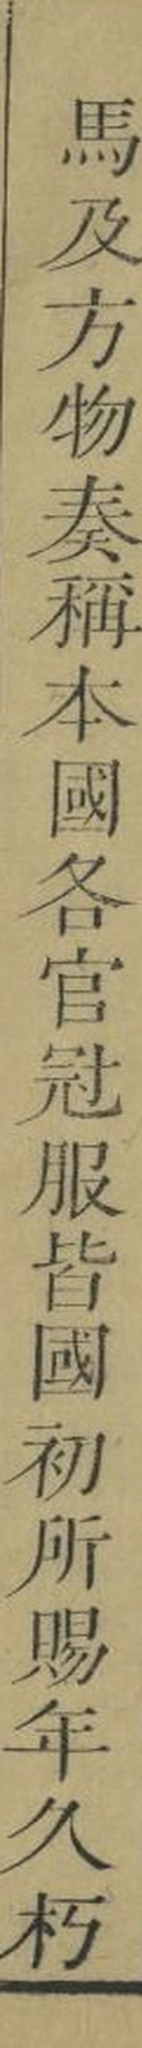馬及方物奏称本国各官冠服皆国初所賜年久朽
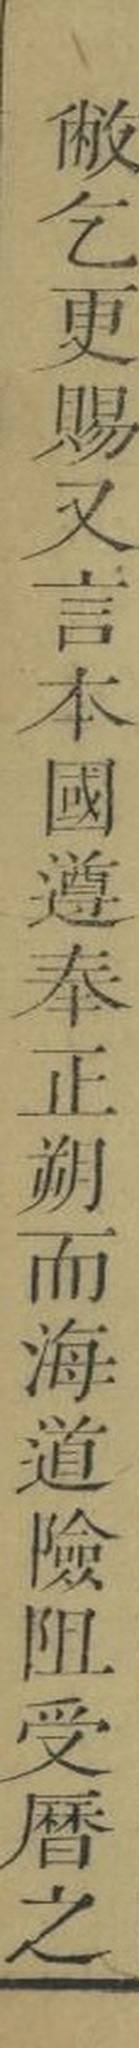敝乞更賜又言本国遵奉正朔而海道険阻受暦之

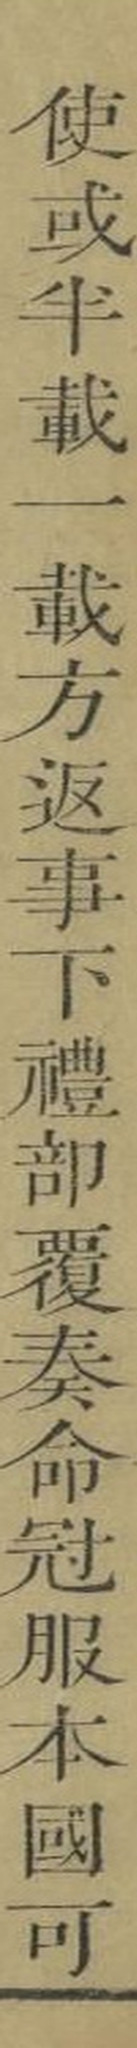使或半載一載方返事下礼部覆奏命冠服本国可
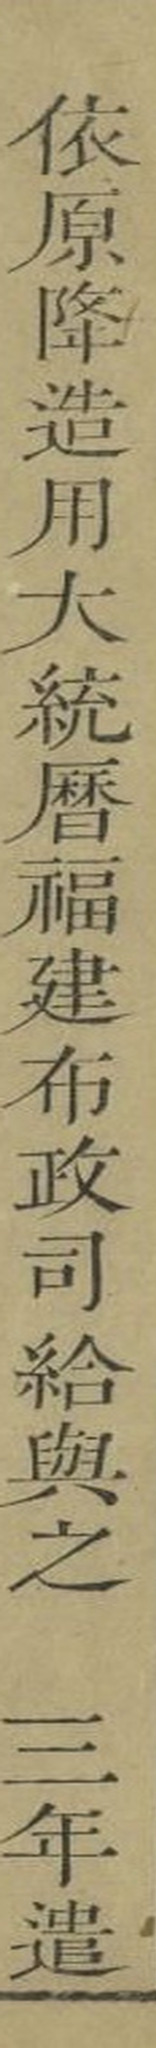依原降造用大統暦福建布政司給与之三年遣
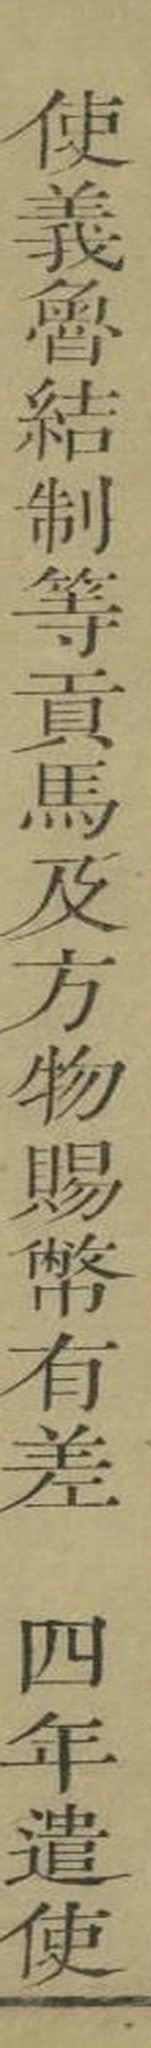使義魯結制等貢馬及方物賜幣有差四年遣使
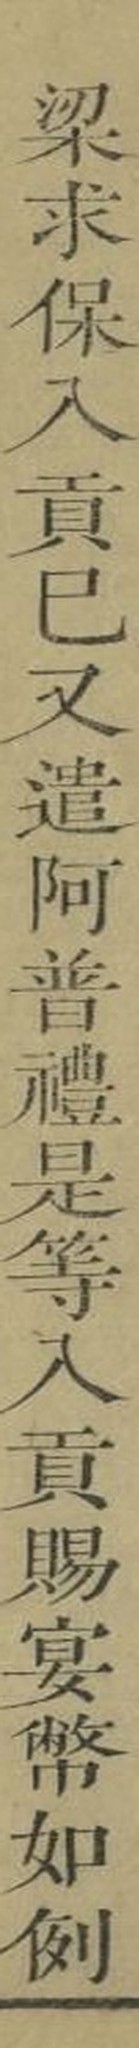梁求保入貢巳又遣阿普礼是等入貢賜宴幣如例
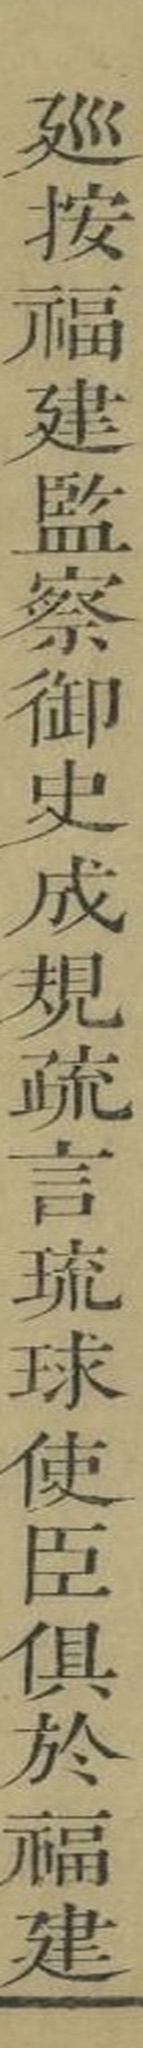巡按福建監察御史成規疏言琉球使臣俱於福建
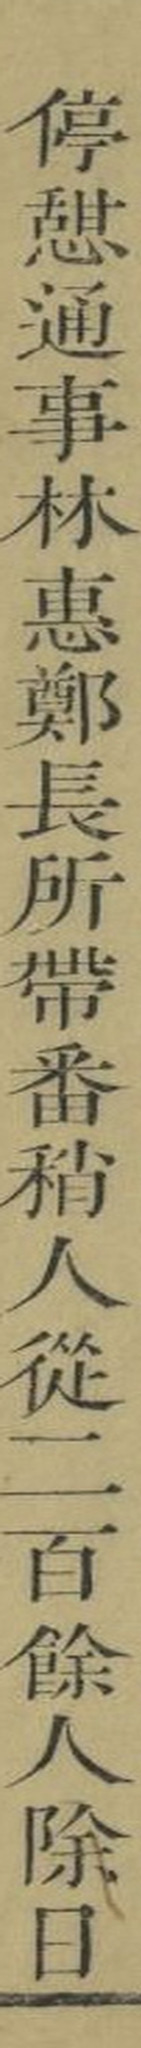停憩通事林恵鄭長所帯番稍人従二百余人除日
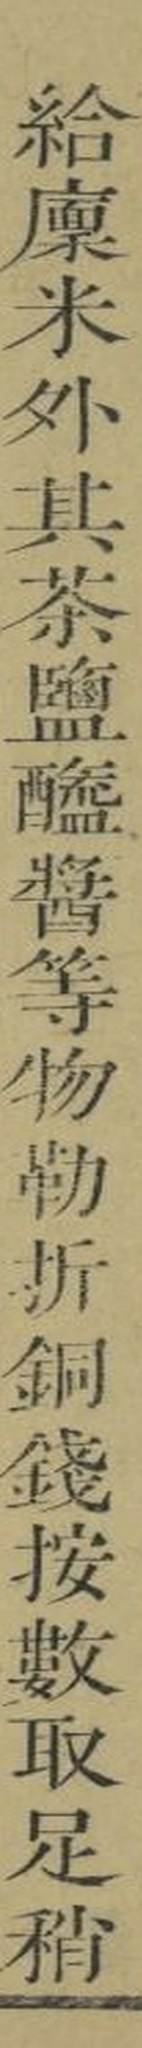給廩米外其茶塩醯醤等物勒折銅銭按数取足稍
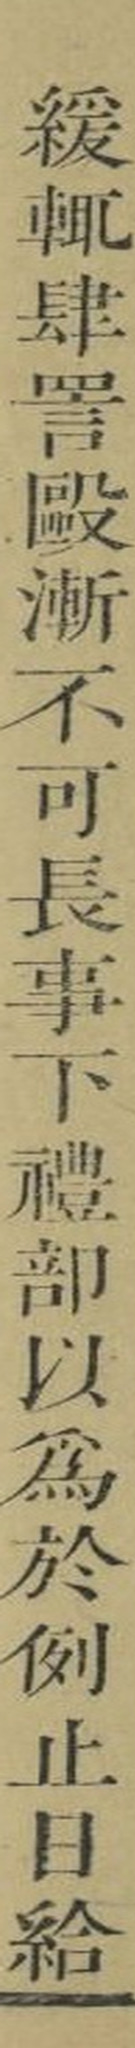緩輒肆詈殴漸不可長事下礼部以為於例止日給
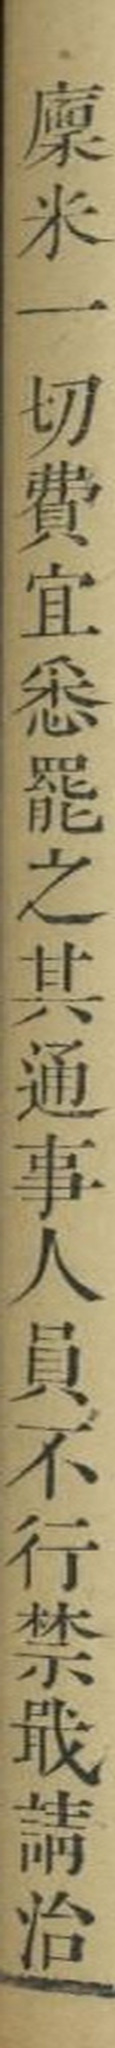廩米一切費宜悉罷之其通事人員不行禁戢請治
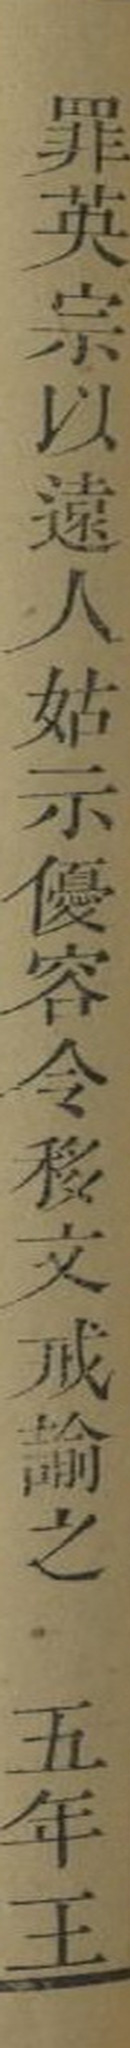罪英宗以遠人姑示優容令移文戒諭之五年王
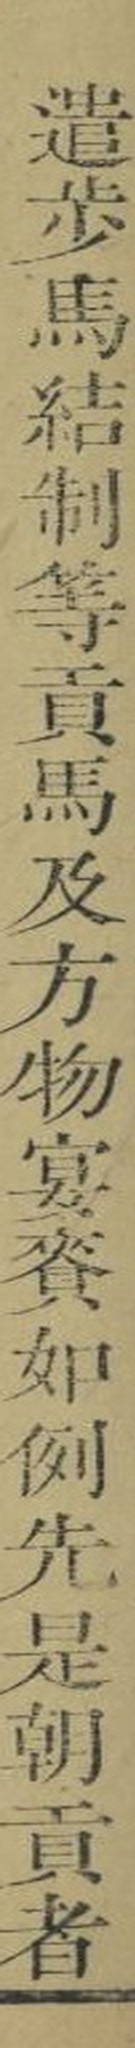遣歩馬結制等貢馬及方物宴賚如例先是朝貢者
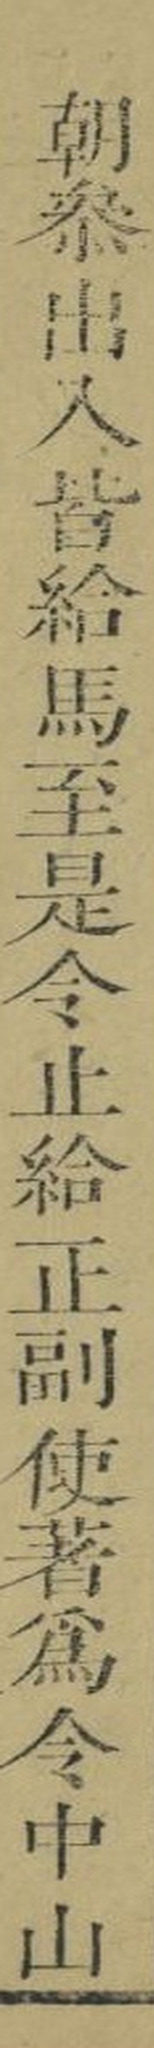朝参出入皆給馬至是令止給正副使著為令中山
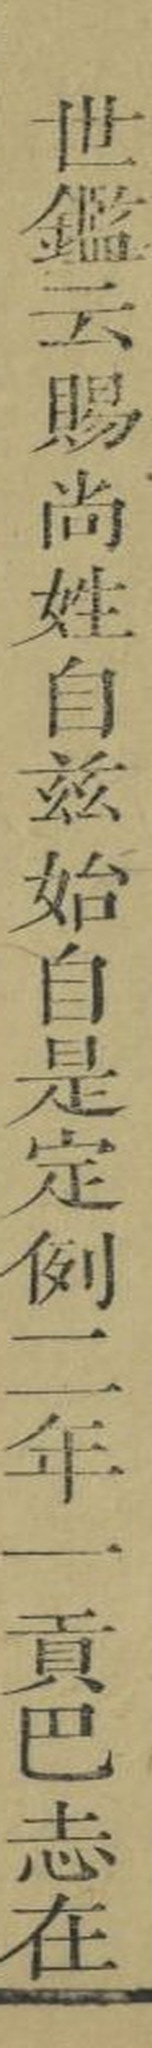世鑑云賜尚姓自茲始自是定例二年一貢巴志在
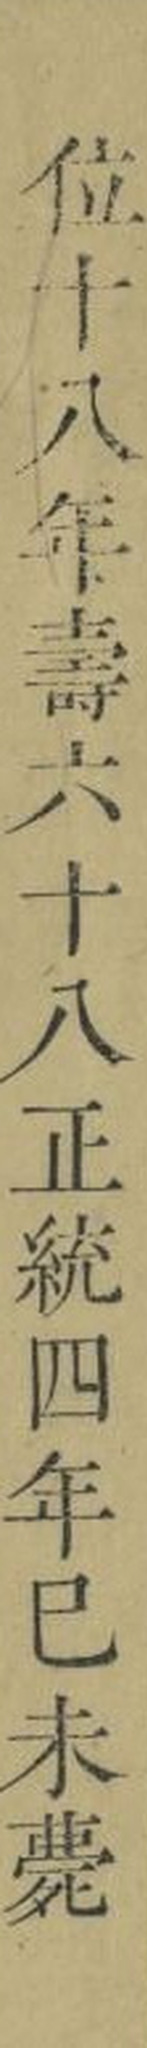位十八年寿六十八正統四年巳未薨
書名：中山伝信録 巻三
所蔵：University of the Ryukyus Library
